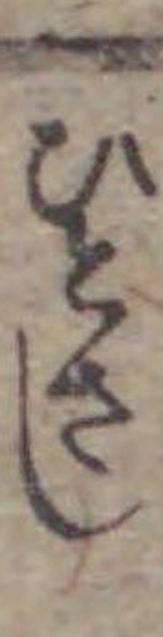ひとさし

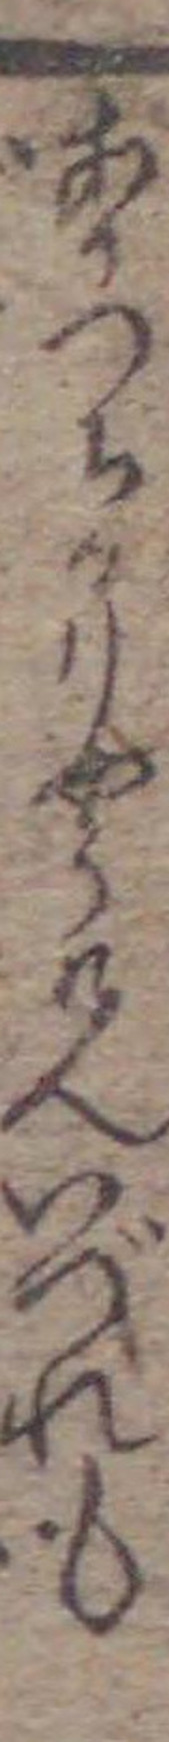あかつちくりやうけんいづれも
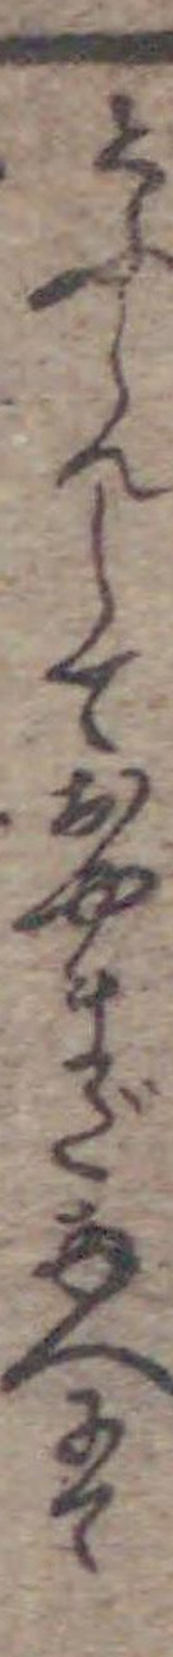どふしんしておやまだゆへにて
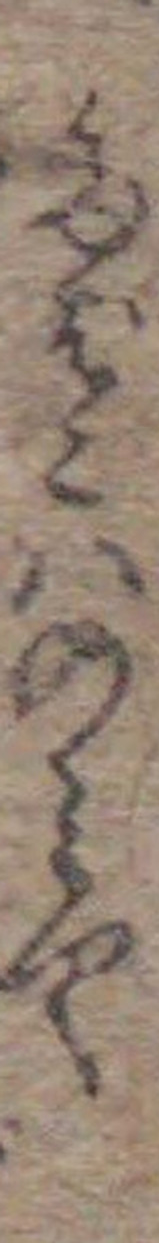たばこはのみや
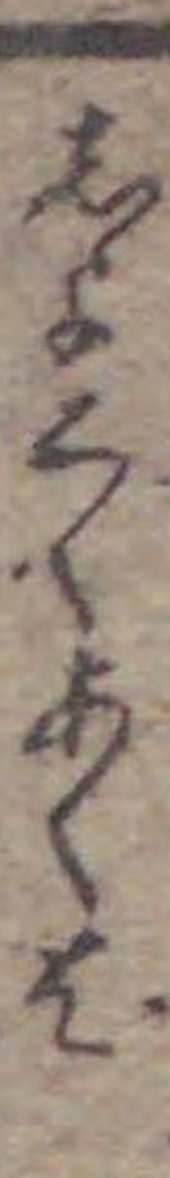しよこくあくは
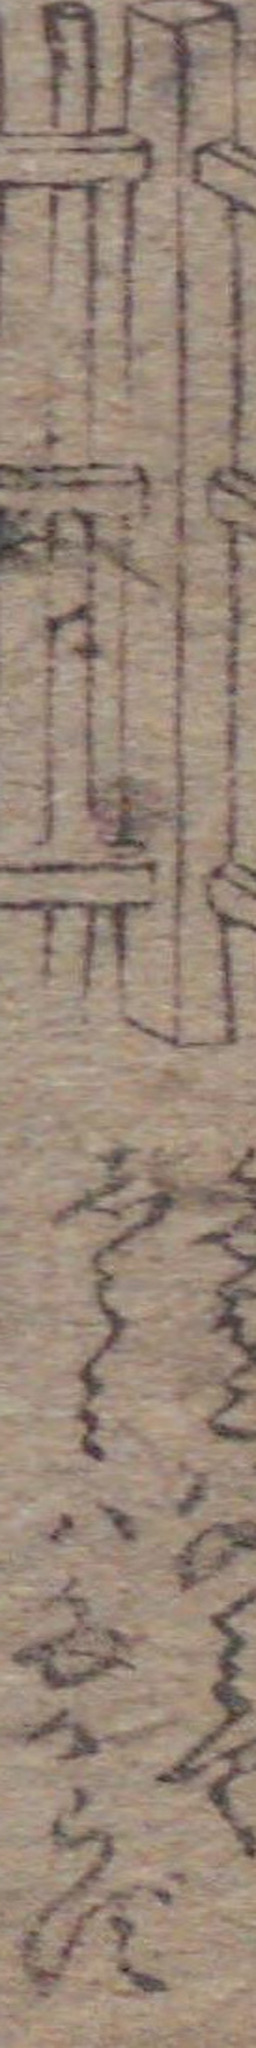しらみはたからず
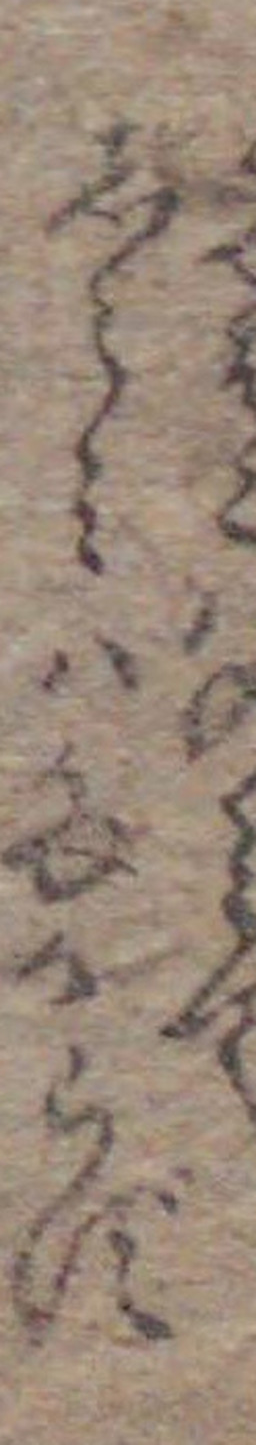しらみはたからず
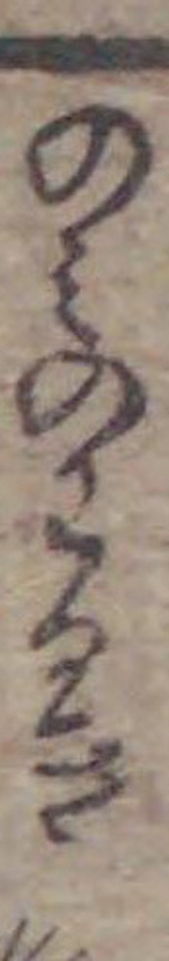のみのわるき
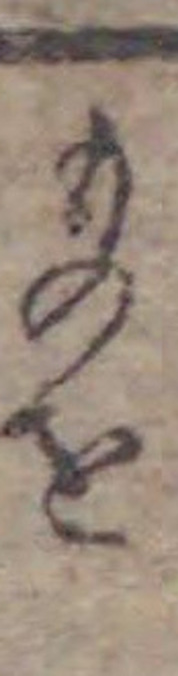ものを
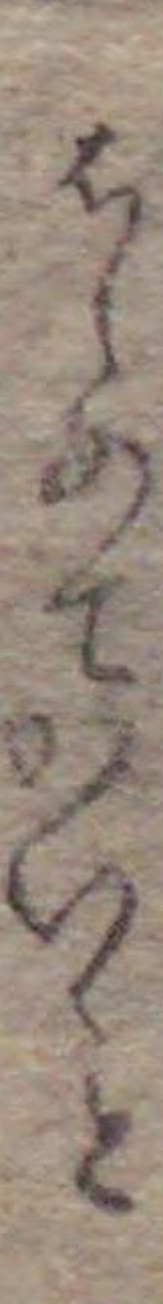はしめてかいゝと
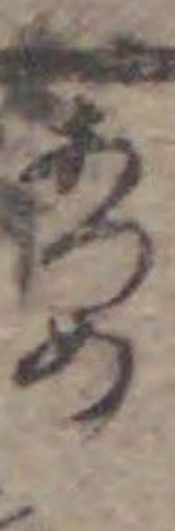あつめ
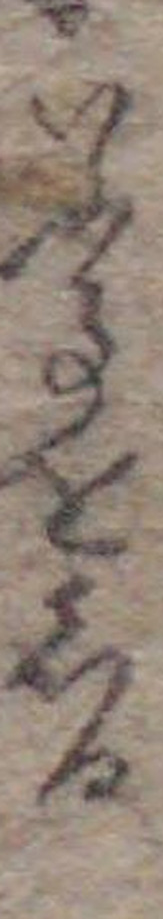いふ事をしる
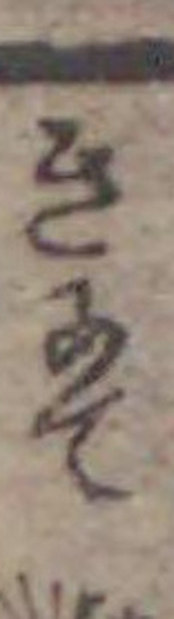きにて
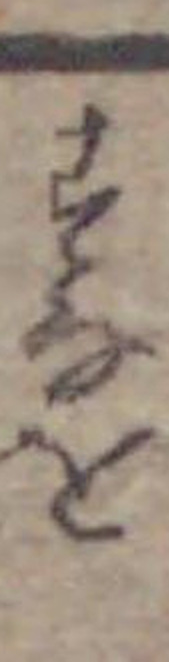すなを
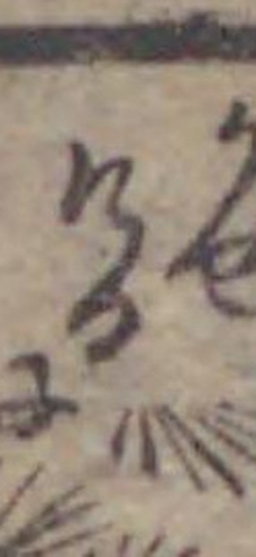けるに
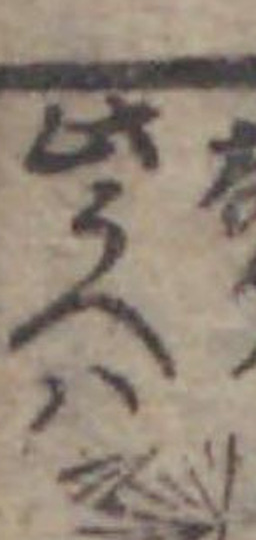此うへは
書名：談芭菰誉詞 : 3巻
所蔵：国立国会図書館 National Diet Library, JAPAN
